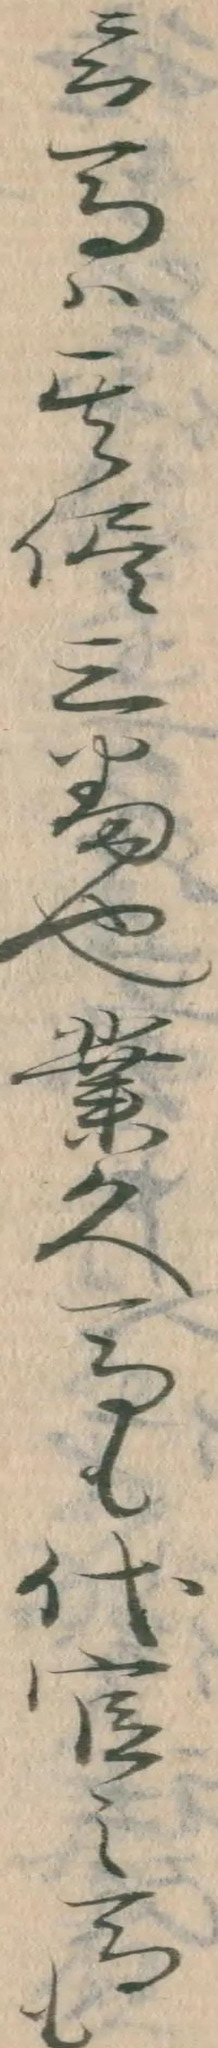ニ而馬ハ其侭三番也業久馬も代官之馬も
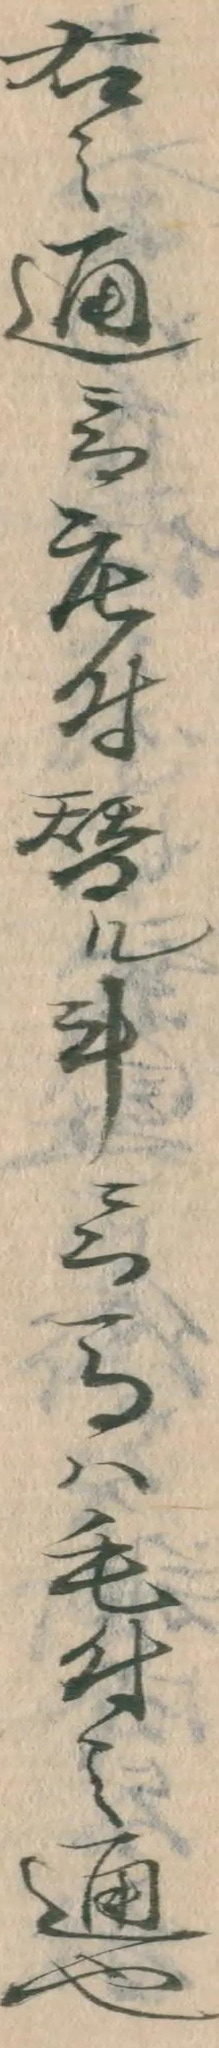右之通ニ而庄付替ル計ニ而馬ハ毛付之通也
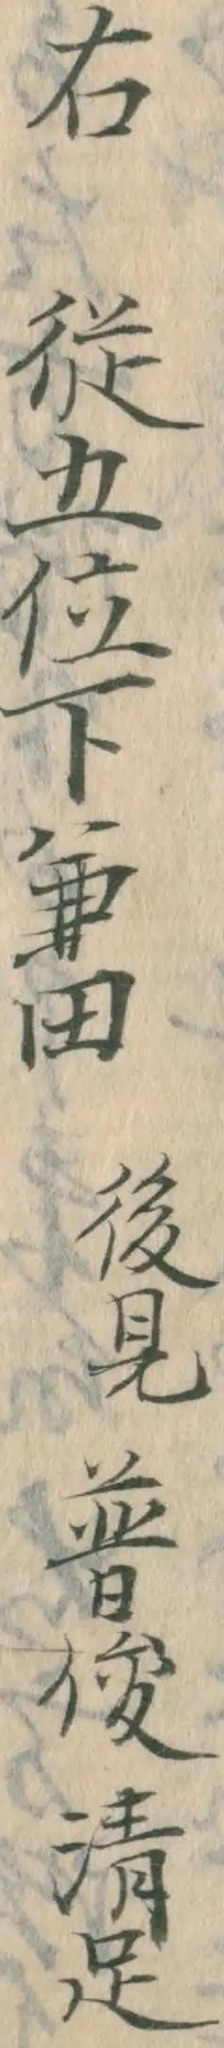右従五位下兼田後見普俊清足

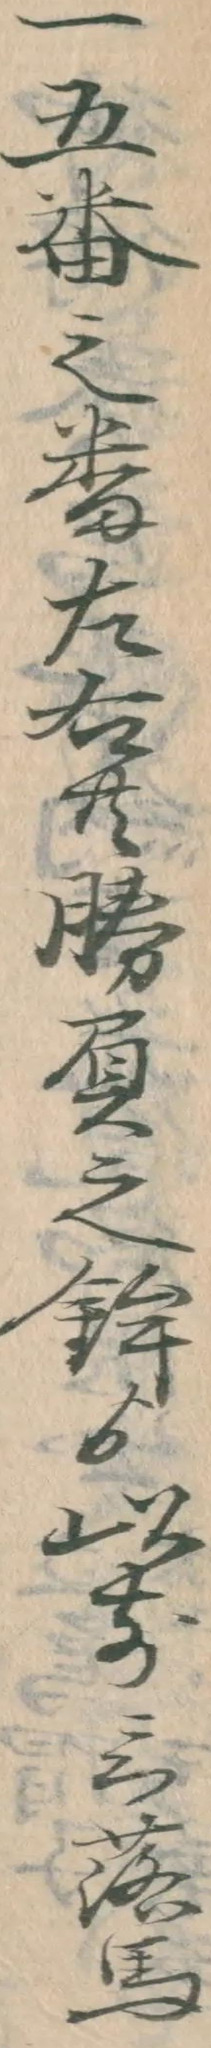一五番之番左右共勝負之鉾ゟ以前ニ而落馬
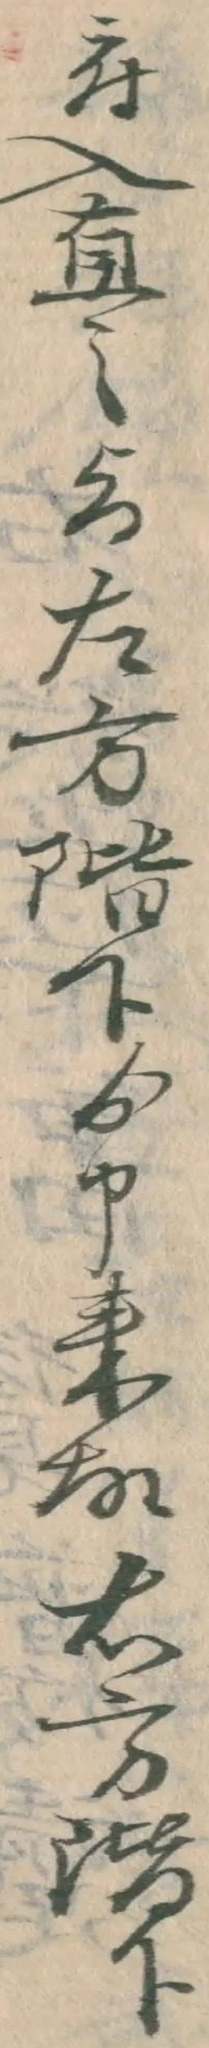ニ付入直之旨左方階下ゟ申来故右方階下
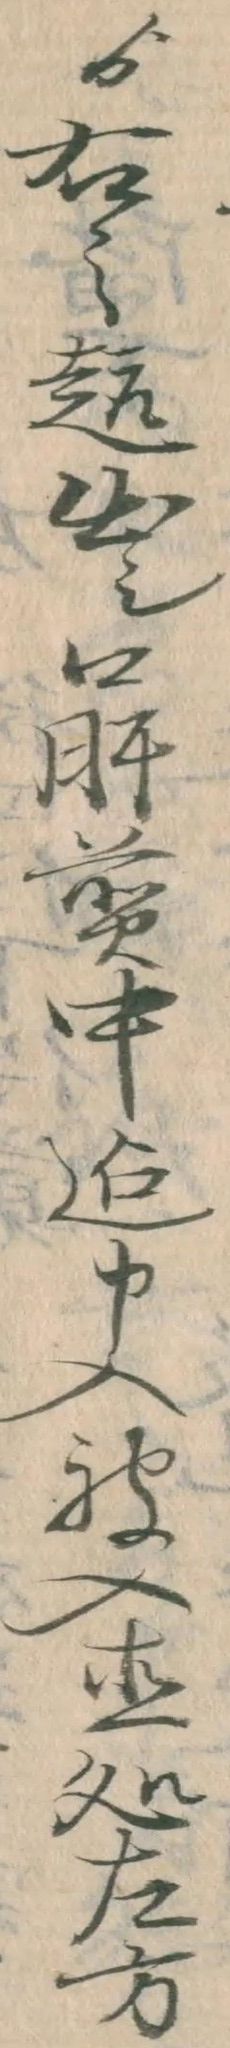ゟ右之趣出シ口肝煎中迄申入被入直処左方
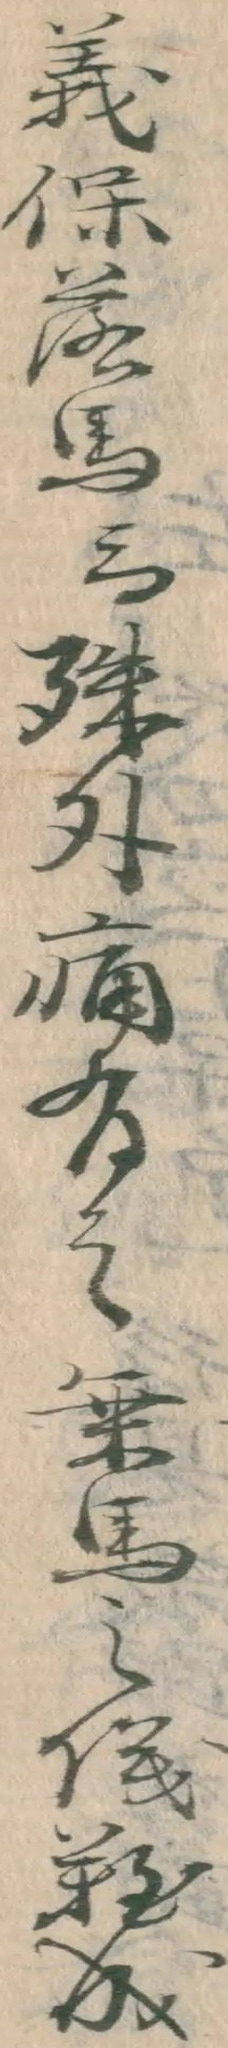義保落馬ニ而殊外痛有之乗馬之儀難成
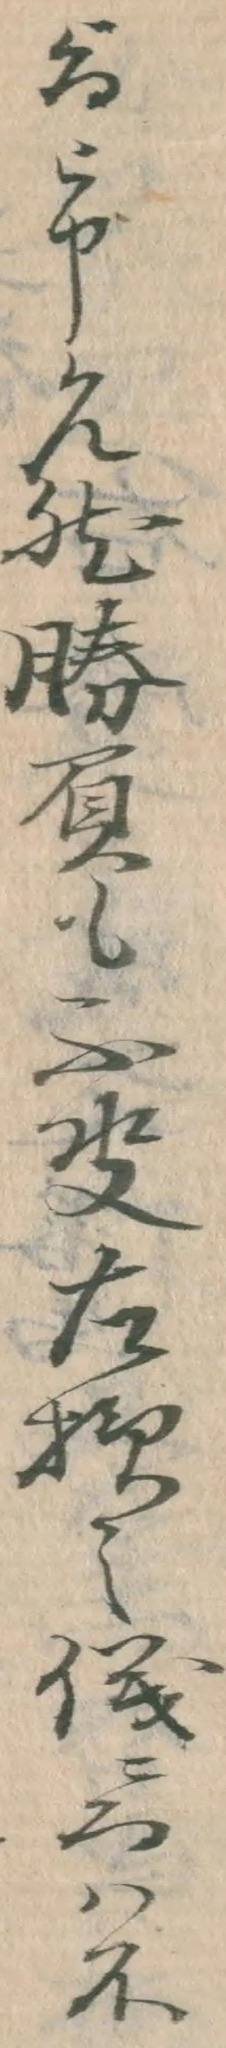旨被申乍然勝負も不決左様之儀ニ而ハ不
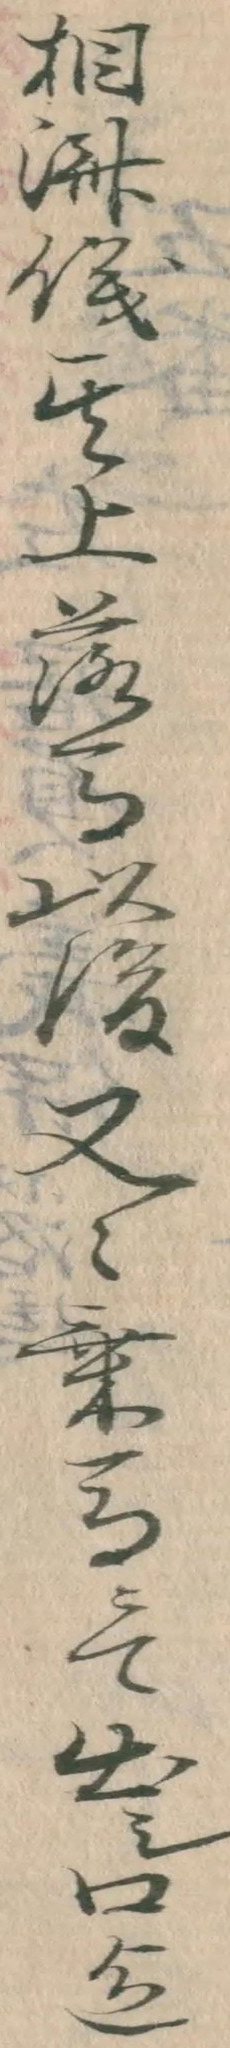相済儀其上落馬以後又々乗馬ニて出シ口迄
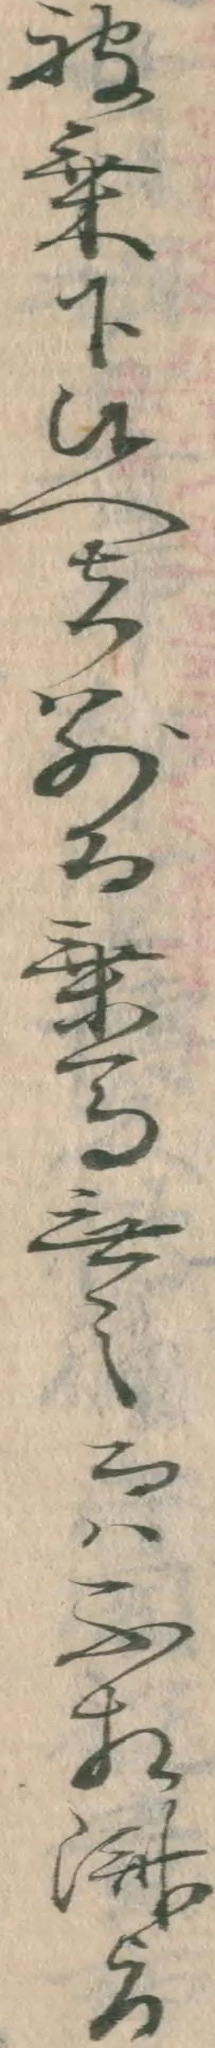被乗下候へ者別而乗馬無之而ハ不相済旨
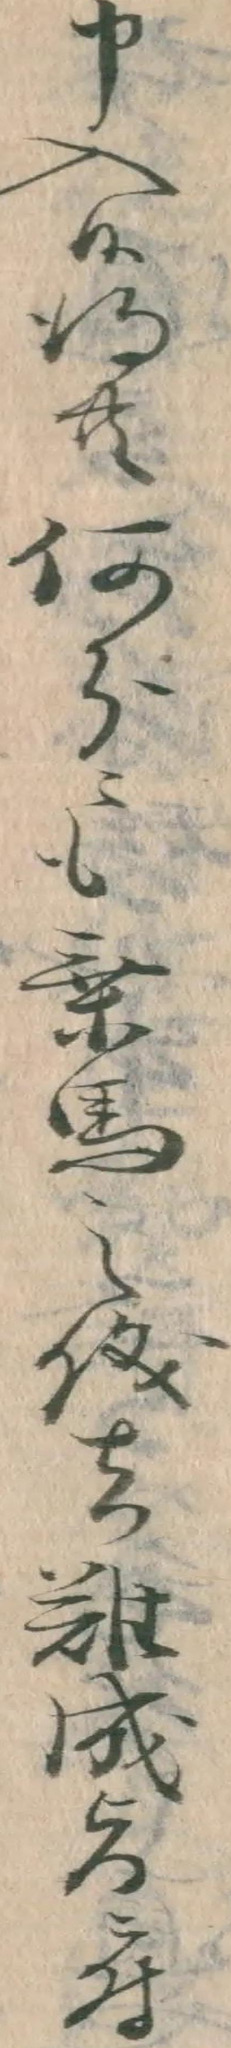申入候得共何分ニも乗馬之儀者難成旨ニ付
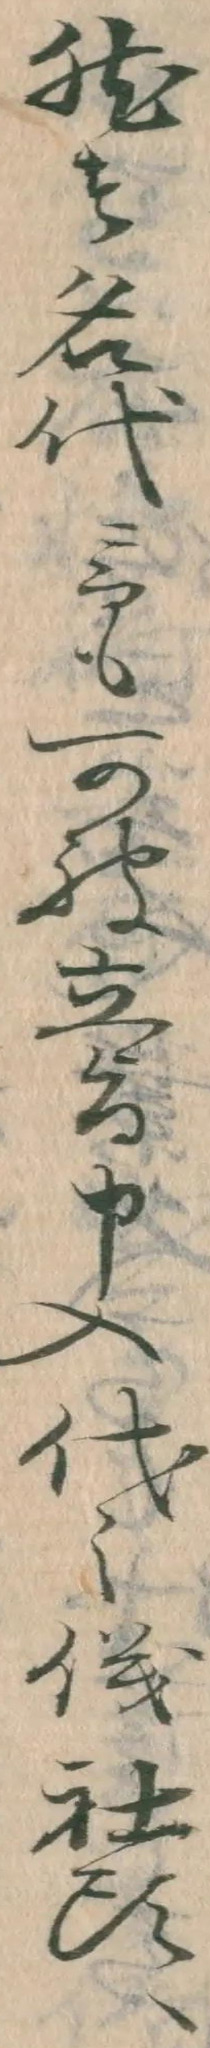然者名代ニ而も可被立旨申入代之儀社頭へ
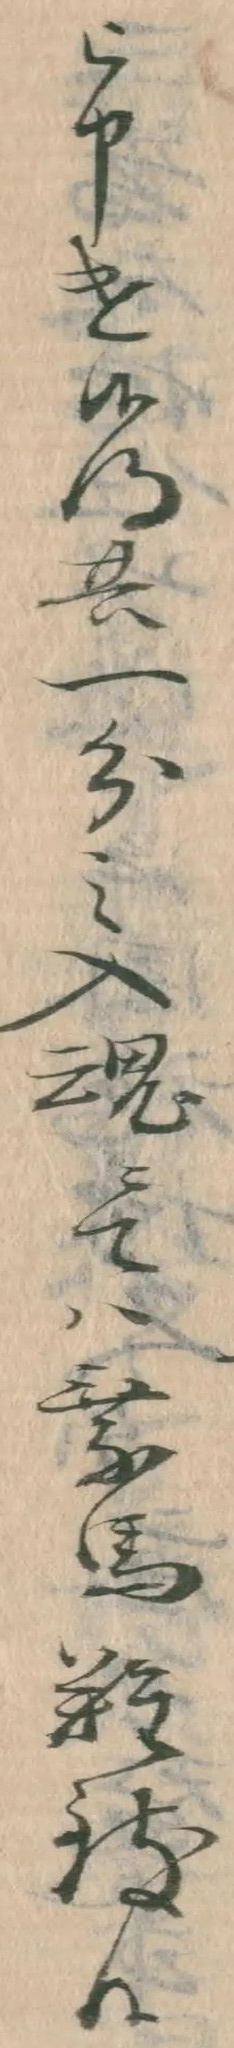被申遣候得共一分之入魂ニてハ乗馬難致候
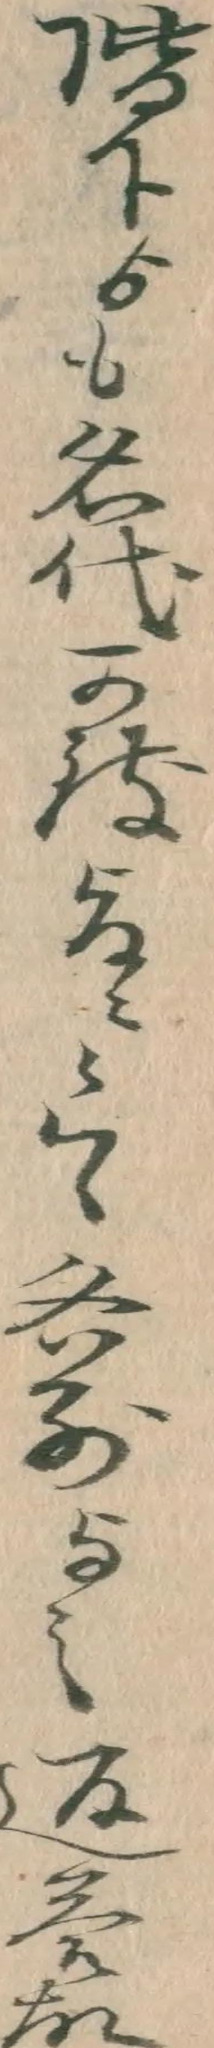階下ゟも名代可致旨ニ候ハゝ各別与之返答故
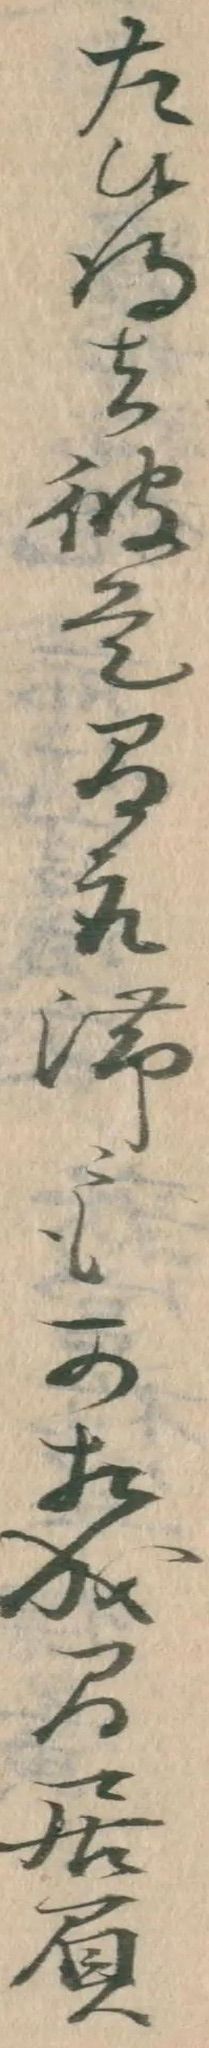左候得者彼是間取滞ニも可相成間居負
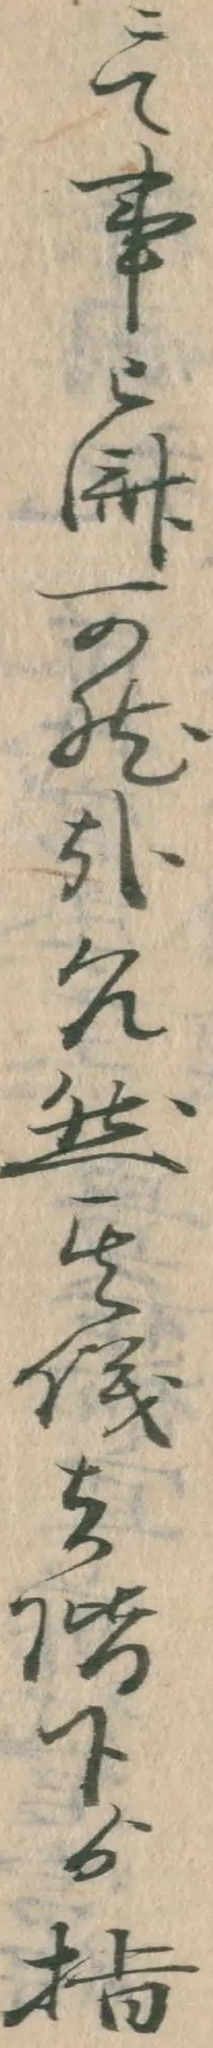ニて事被済可然哉乍然其儀者階下ゟ指
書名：賀茂社記録. 第10冊
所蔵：国立国会図書館 National Diet Library, JAPAN
